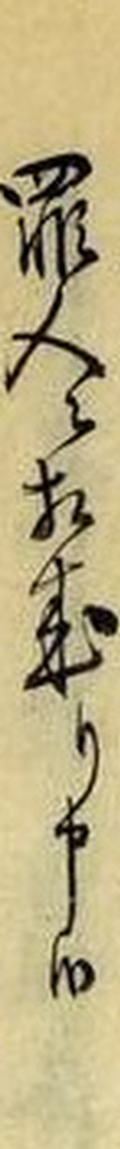罪人ニ相成り申候
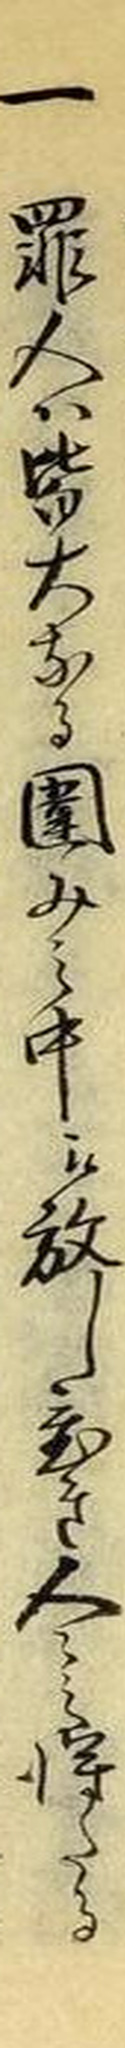一罪人ハ皆大なる囲み之中江放し置き人々之得たる
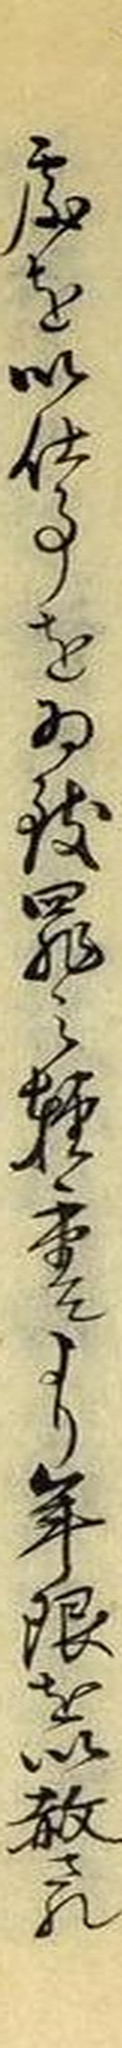處を以仕事を為致罪之軽重ニより年限を以赦され
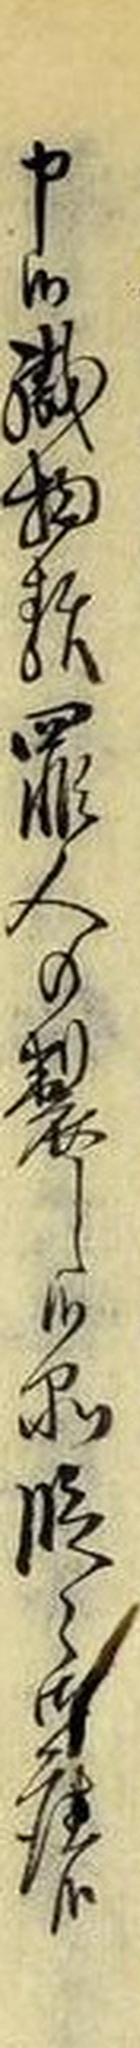申候織物類罪人の製し候品段々御座候
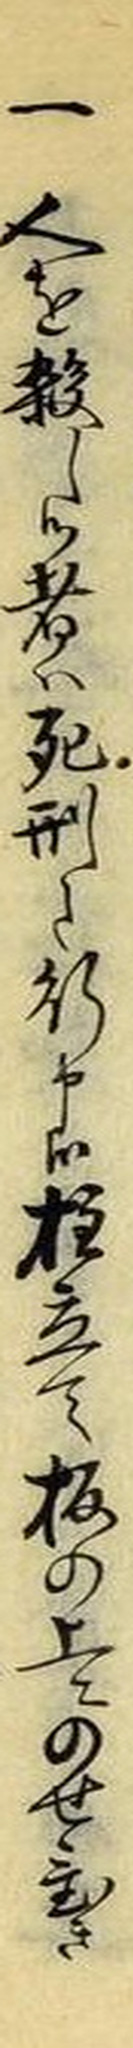一人を殺し候者ハ死刑に行申候柱立て板の上二のせ置き
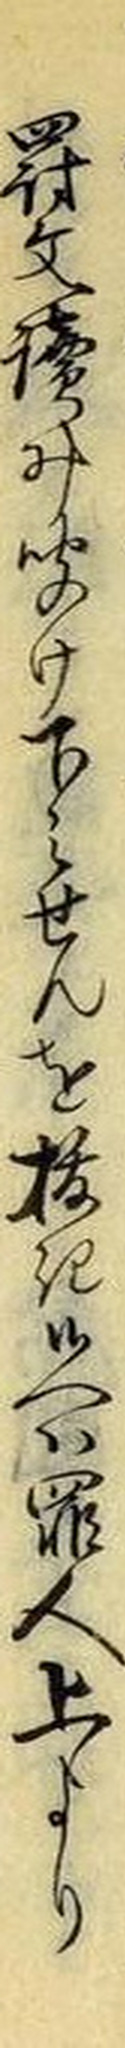罪文読み聞け下之せんを抜き候へハ罪人上より
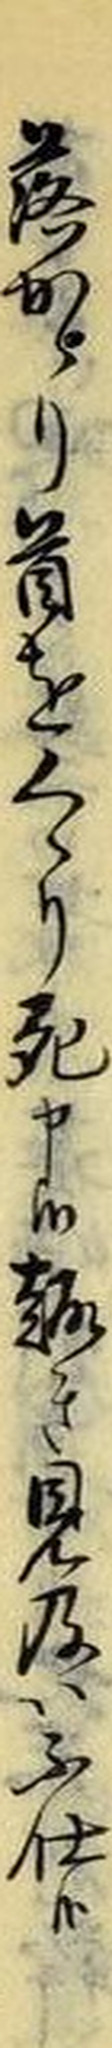落かゝり首をくゝり死申候趣き見及ハ不仕候
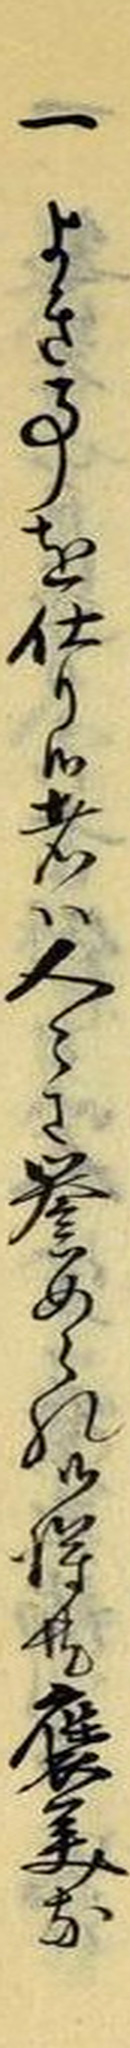一よき事を仕り候者ハ人々に誉められ候得共褒美な
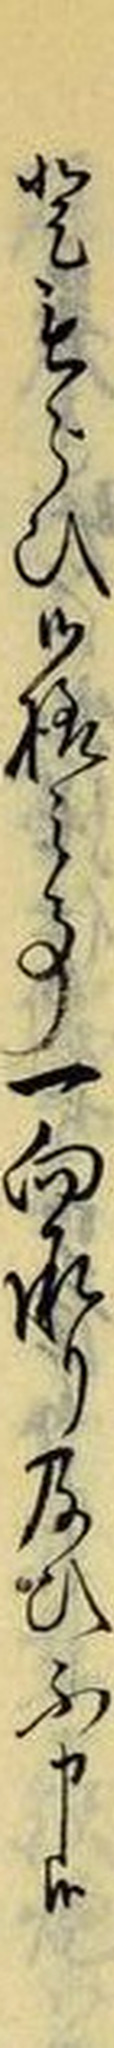ともらひ候様之事一向承り及ひ不申候
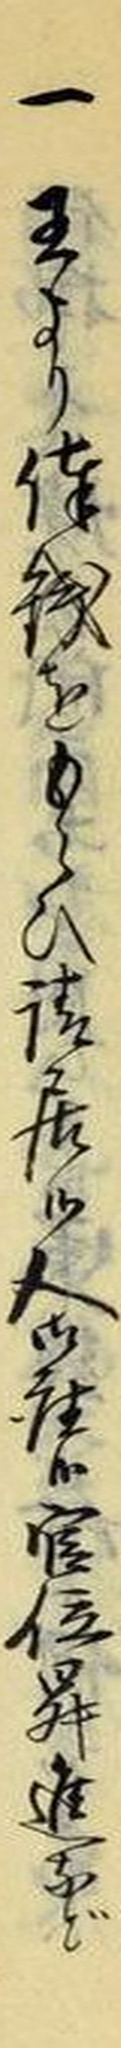一王より俸銭をもらひ請居候人御座候官位昇進など
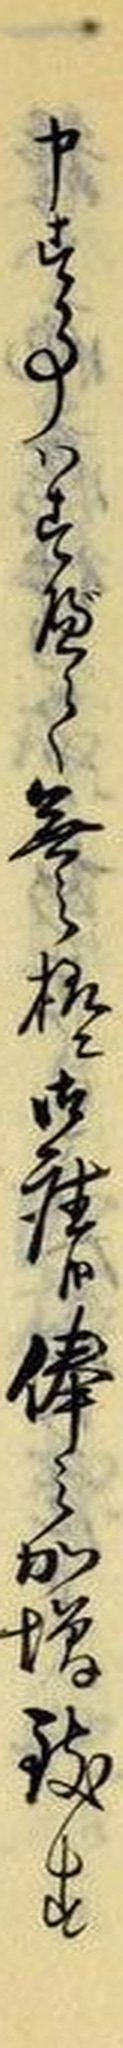申事ハすべて無之様ニ御座候俸之加増致す
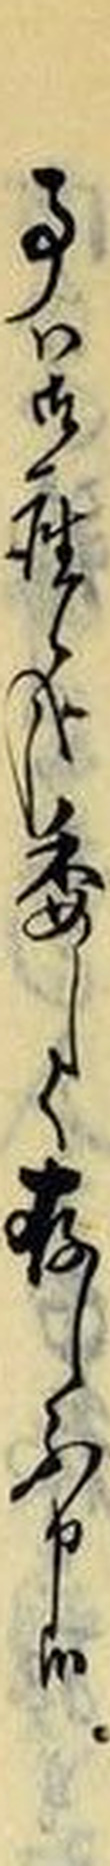事ハ御座候哉委しく存し不申候
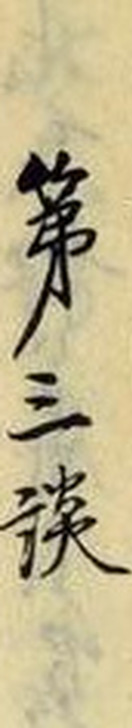第三談
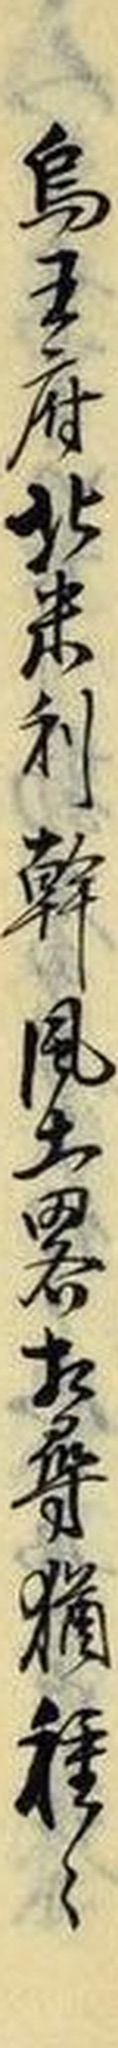島王府北米利幹風土略相猶程々
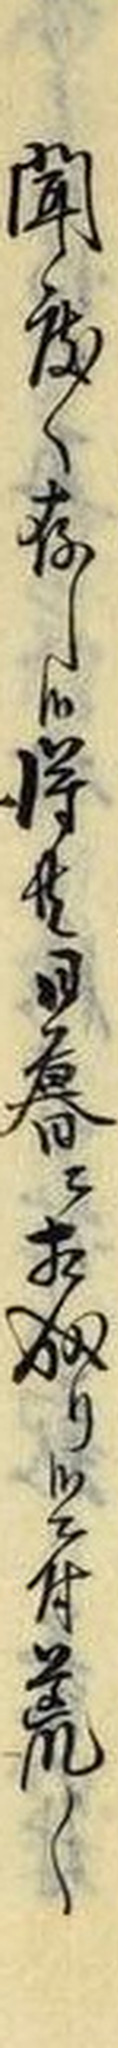聞度く存し候得共日暮ニ相成り候ニ付荒く
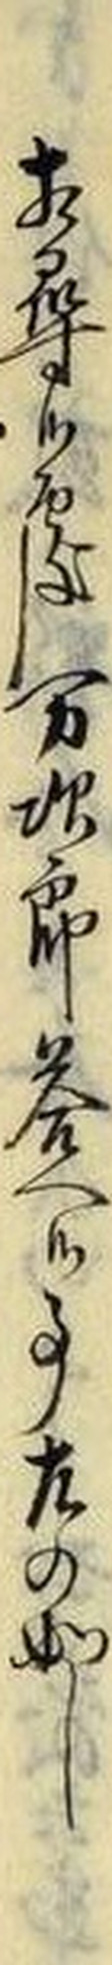相尋候處万次郎答へ候事左の如し
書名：漂客談奇（備考雑録写8）
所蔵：福井県文書館 Fukui Prefectural Archives
